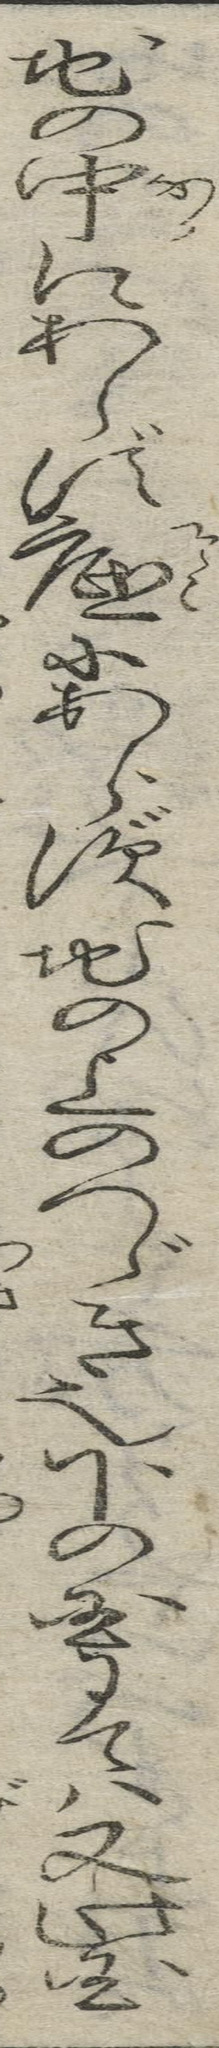地の中にあらず底にあらず地の上のつゞき也下の国にては又此国
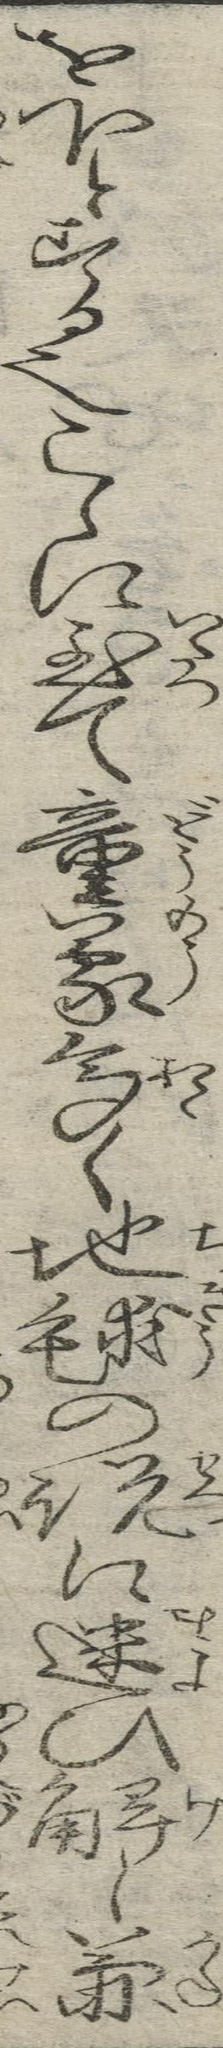を下とする也こゝに至て童蒙多く地毬の説に迷ひ解し兼
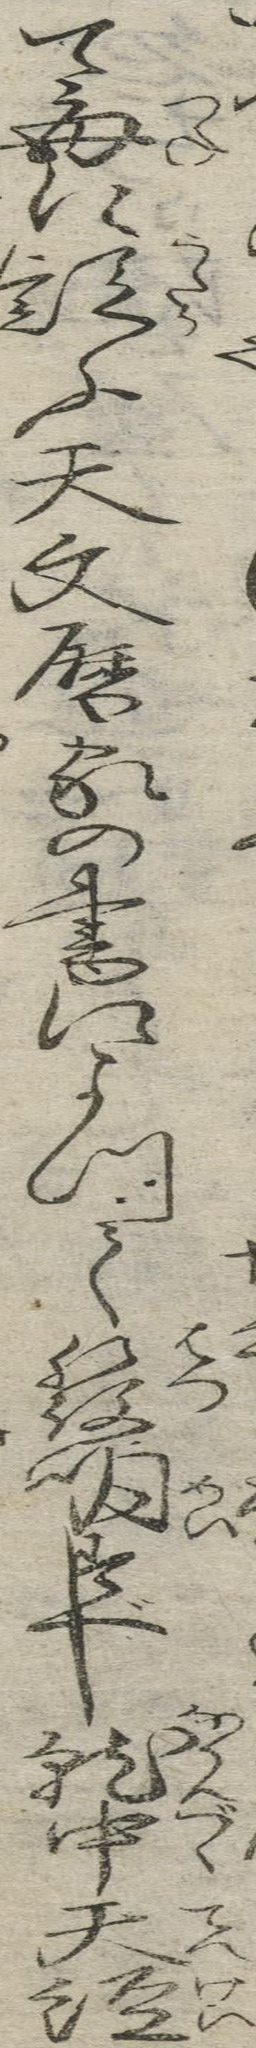て毎に疑ふ天文暦家の書によつて発明すべし就中天経
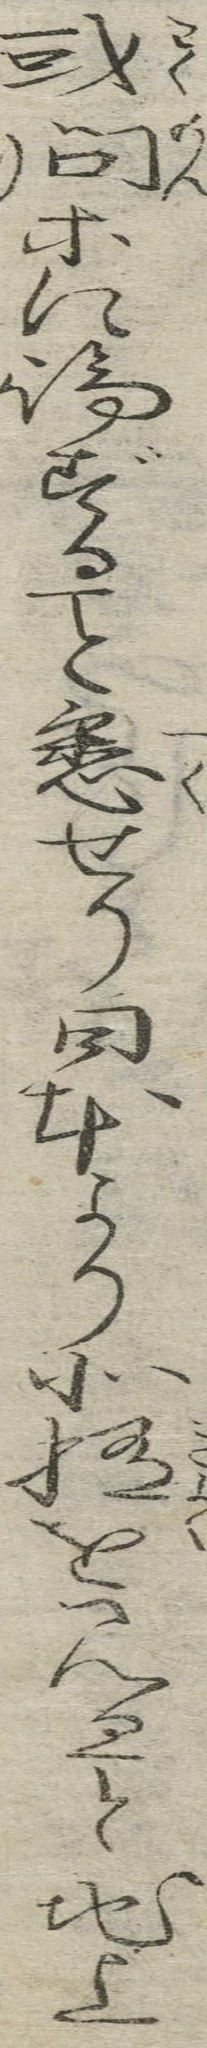或問等に論ずること悉せり日本より北極を見ること地上
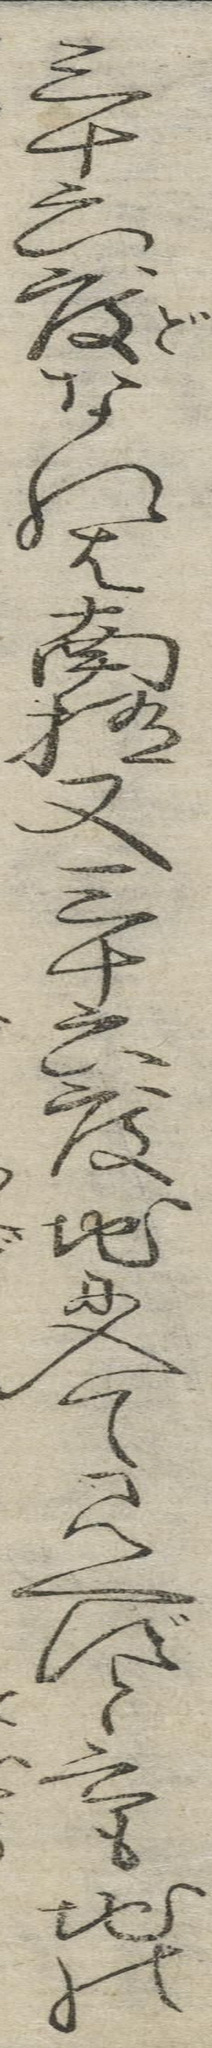三十六度なれは南極又三十六度地に入てみへずと云も地の
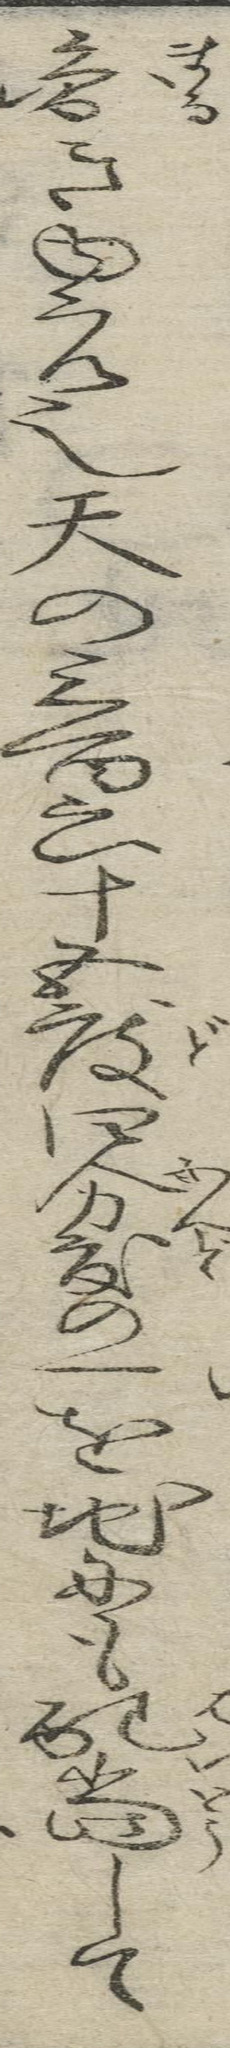円きゆえ也天の三百六十五度四分度の一を地にも配当して
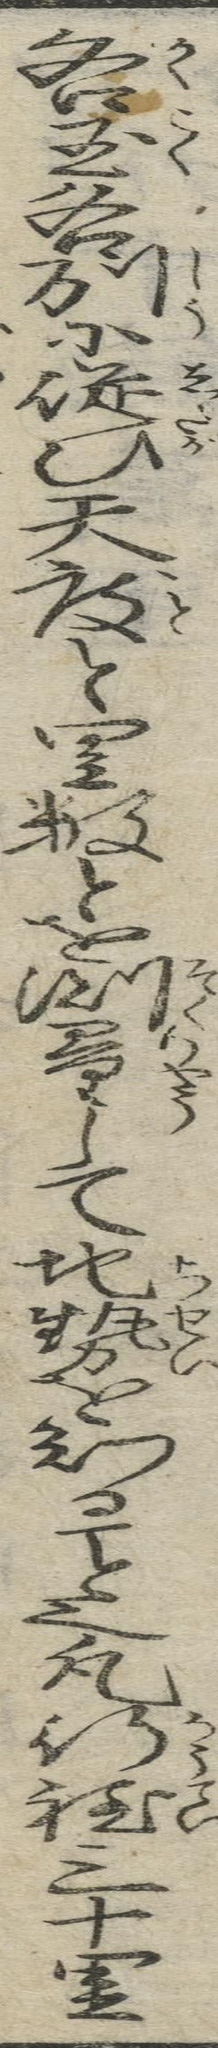各国各州に従ひ天度と里数とを測量して地勢を知ること也凡行程三十里
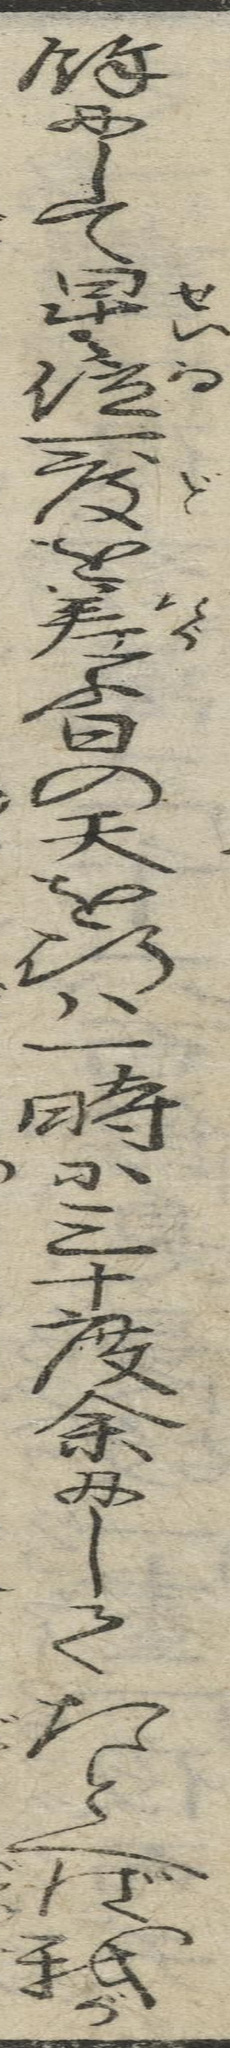余にして星位一度を差ふ日の天を行くは一時に三十六度余にしてたとへば我が
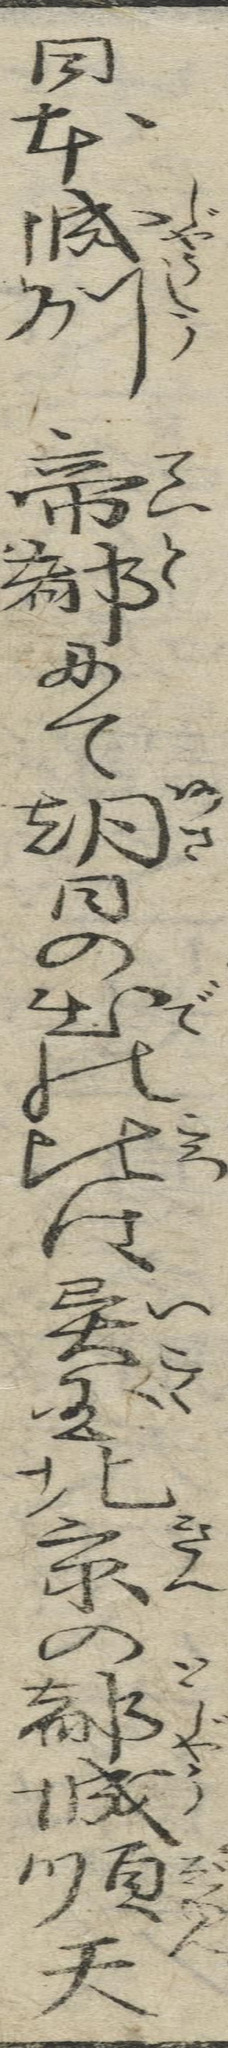日本城州帝都にて朝日の出の比は異国北京の都城順天
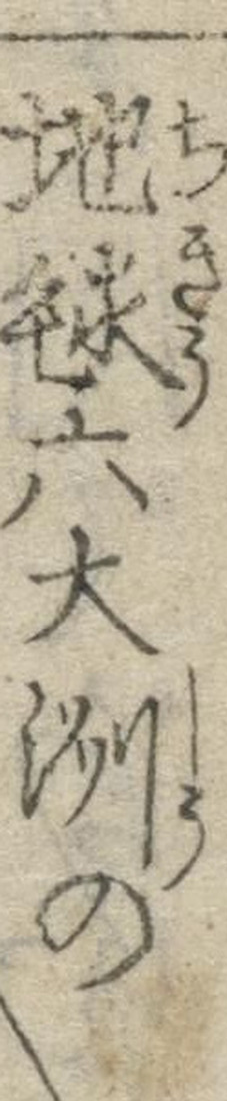地毬六大洲のお
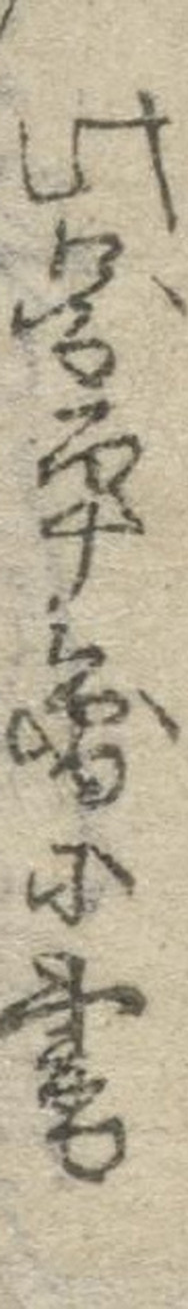此図平円に書
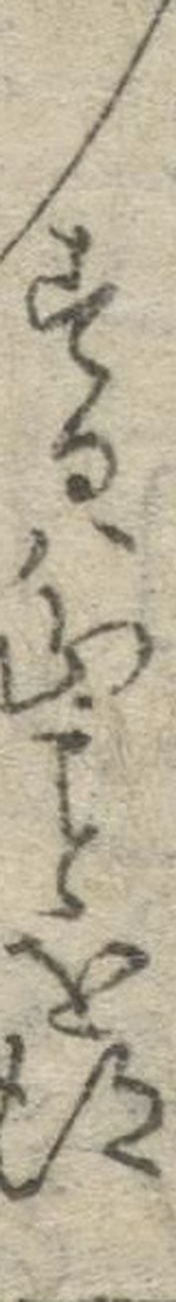するは止ことを得
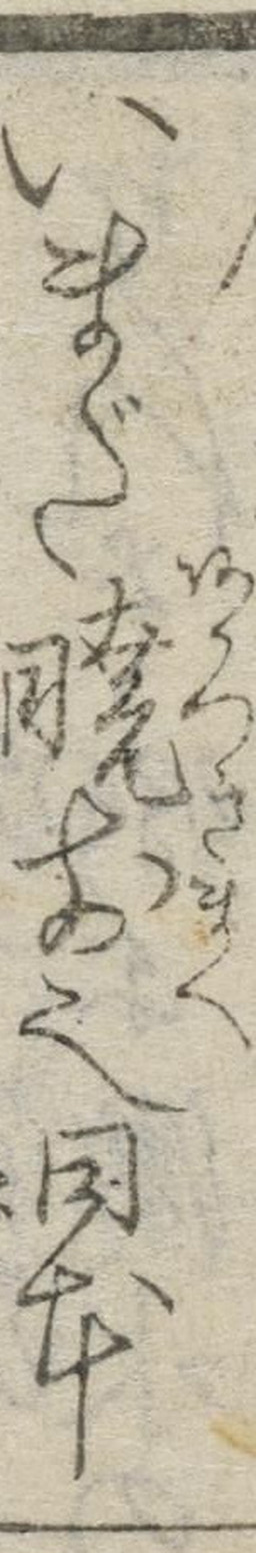いまだ暁前也日本
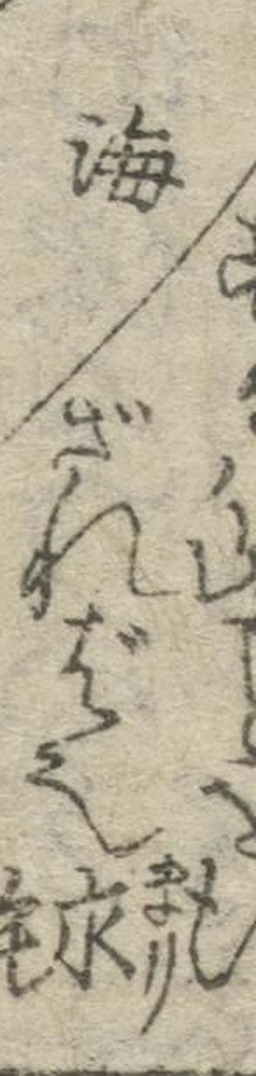ざれば也毬
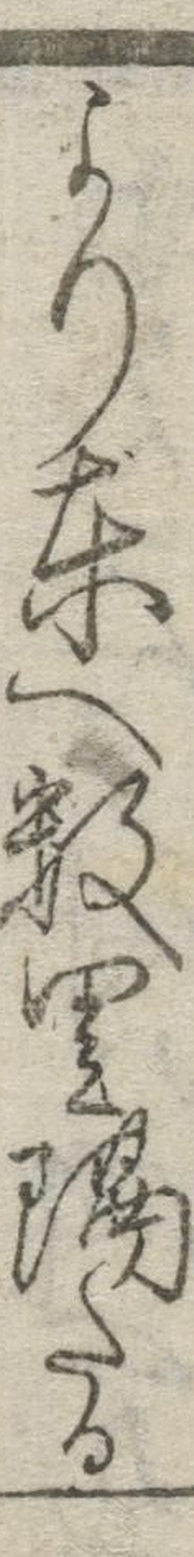より東へ数里隔たる
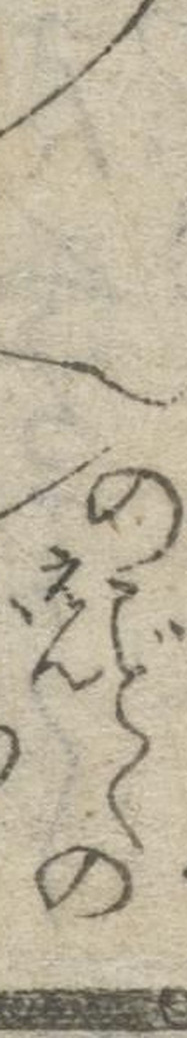のごとくの
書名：訓蒙天地辨　天
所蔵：東京大学地震研究所図書室 Earthquake Research Institute Library, The University of Tokyo, JAPAN
